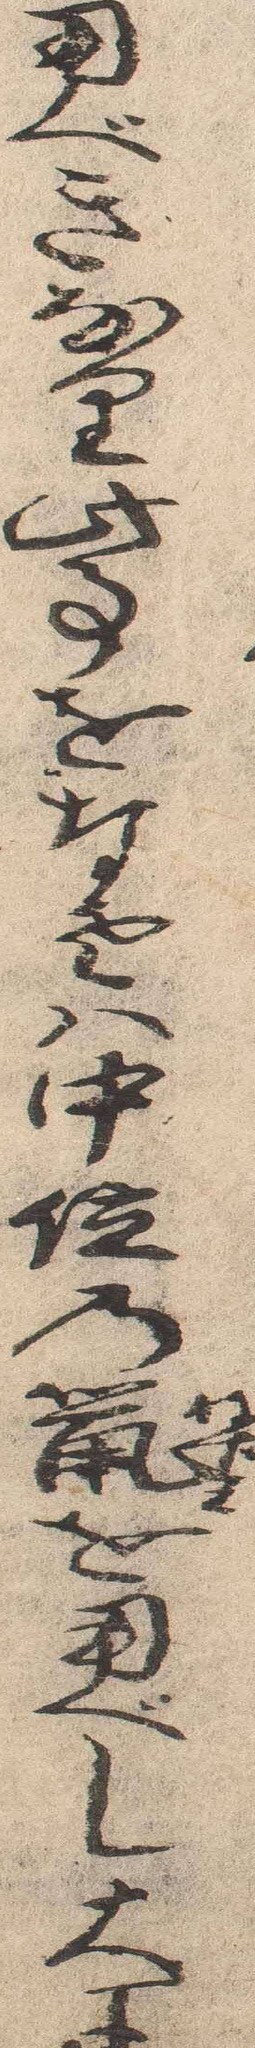用べきなり此事をなさは中位の鼠を用べし大に
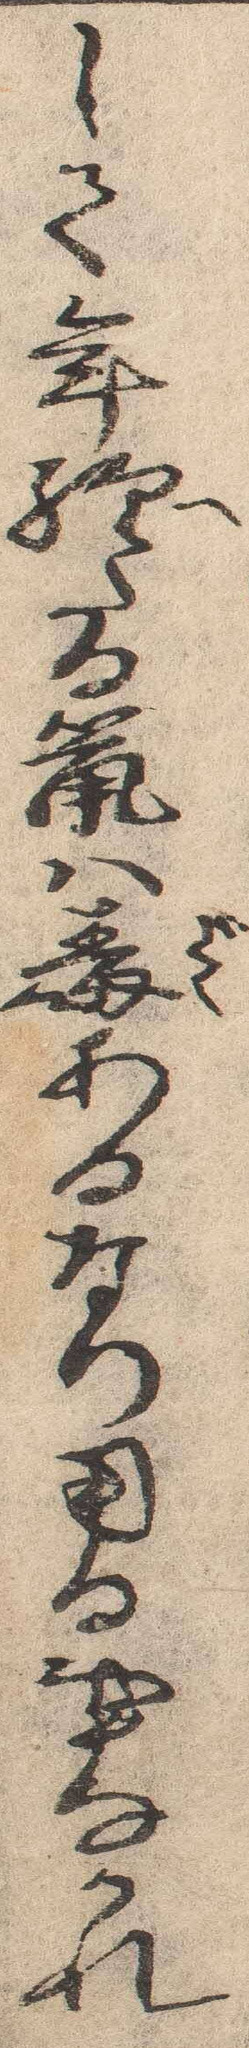して年経たる鼠は毒あるなり用る事なかれ

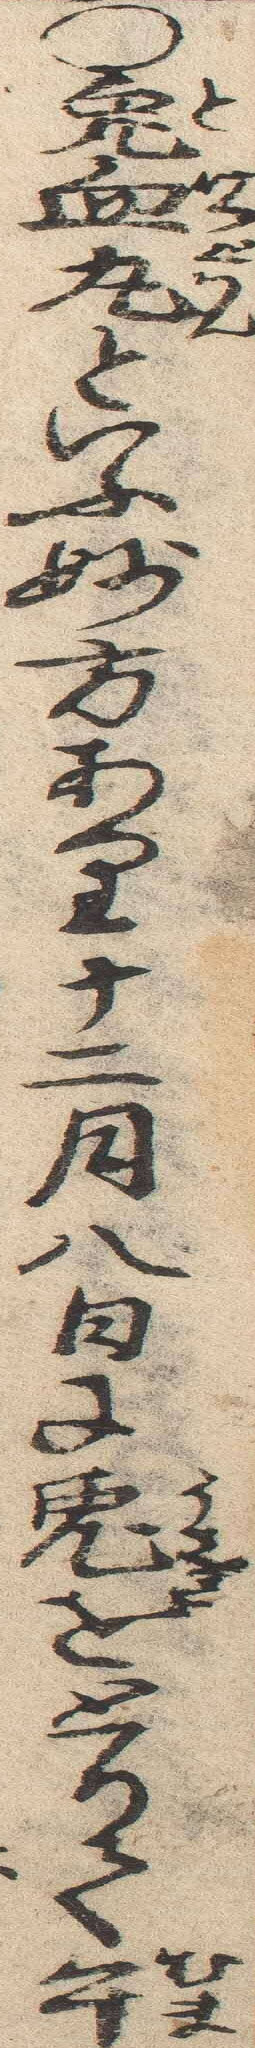○兔血丸といふ妙方あり十二月八日に兔をとりて午
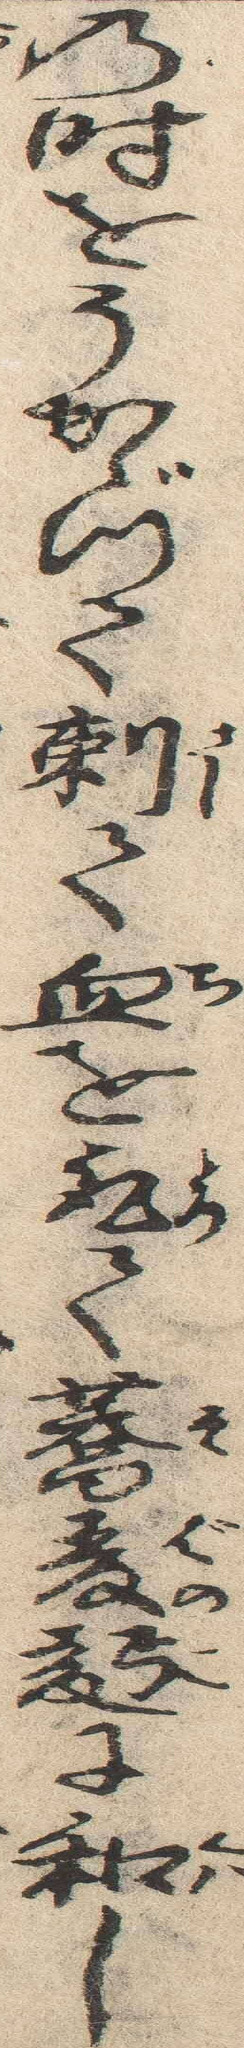の時をうかゞつて刺て血を取て蕎麦麪に和し
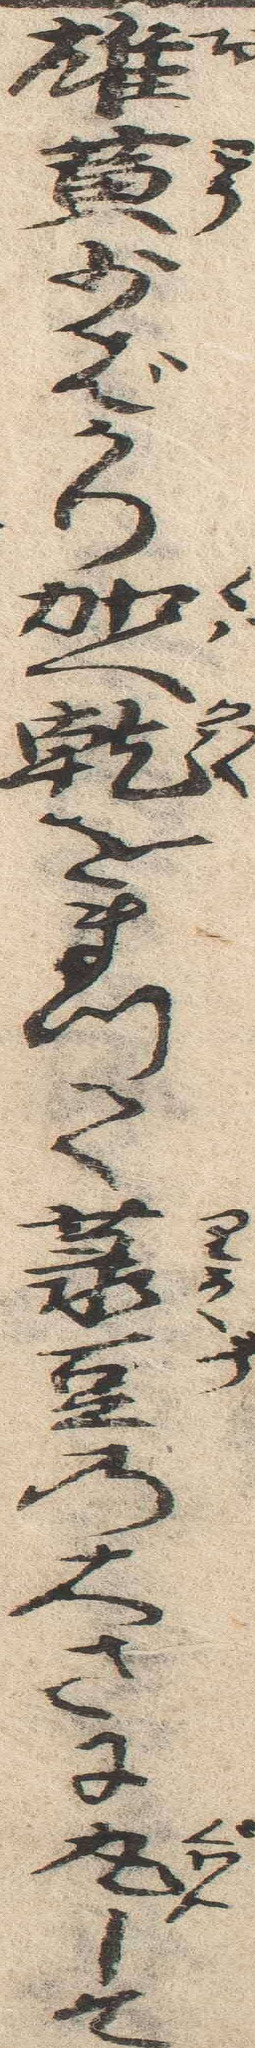雄黄少ばかり加へ乾をまつて菉豆の大さに丸して
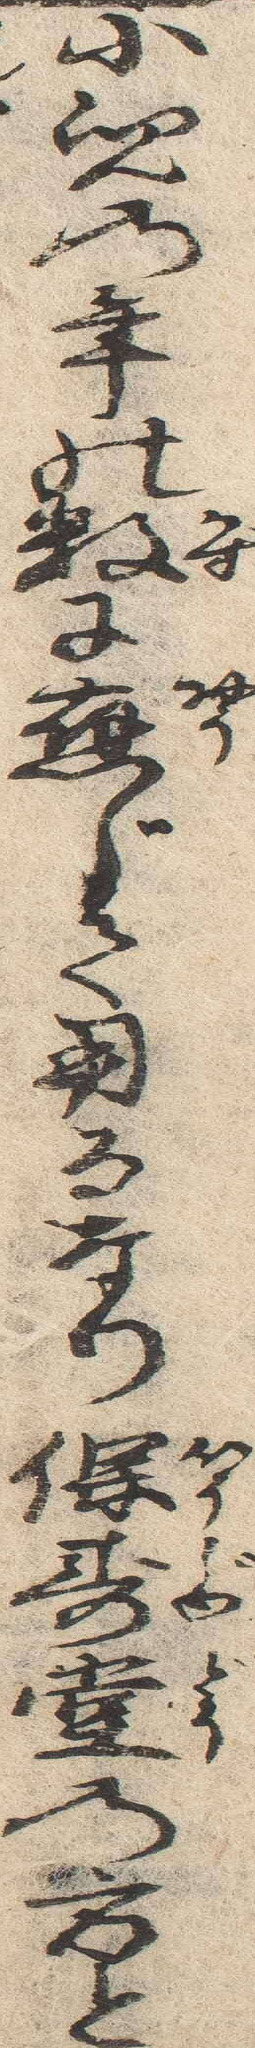小児の年の数に応じて用るなり保寿堂の方と
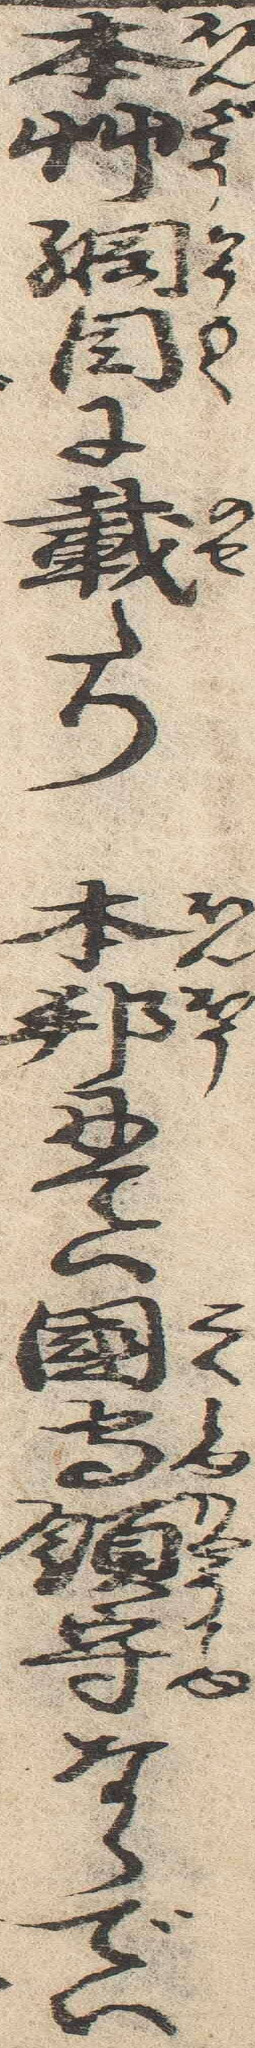本草綱目に載たり本邦にては国守領守ならでは
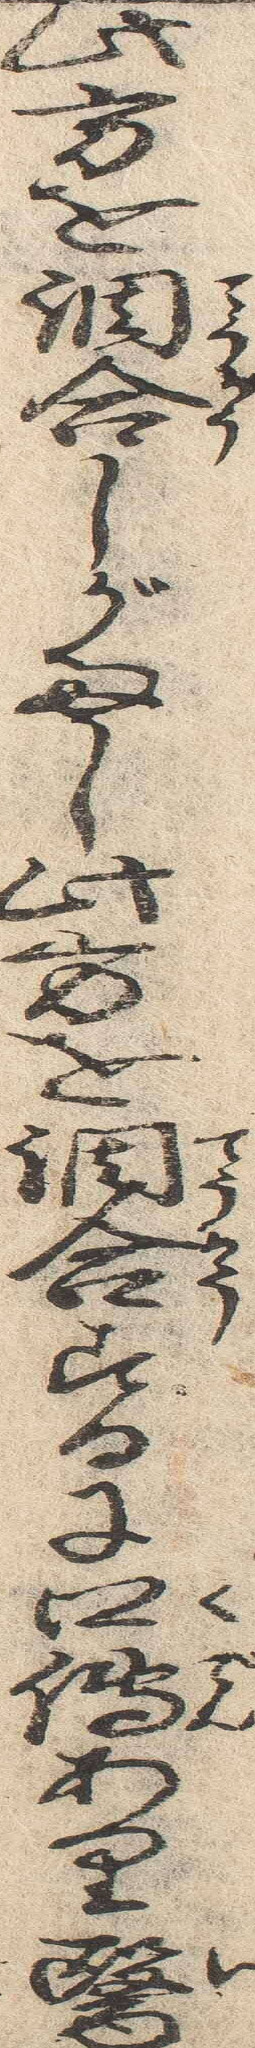此方を調合しがたし此方を調合するに口伝あり医
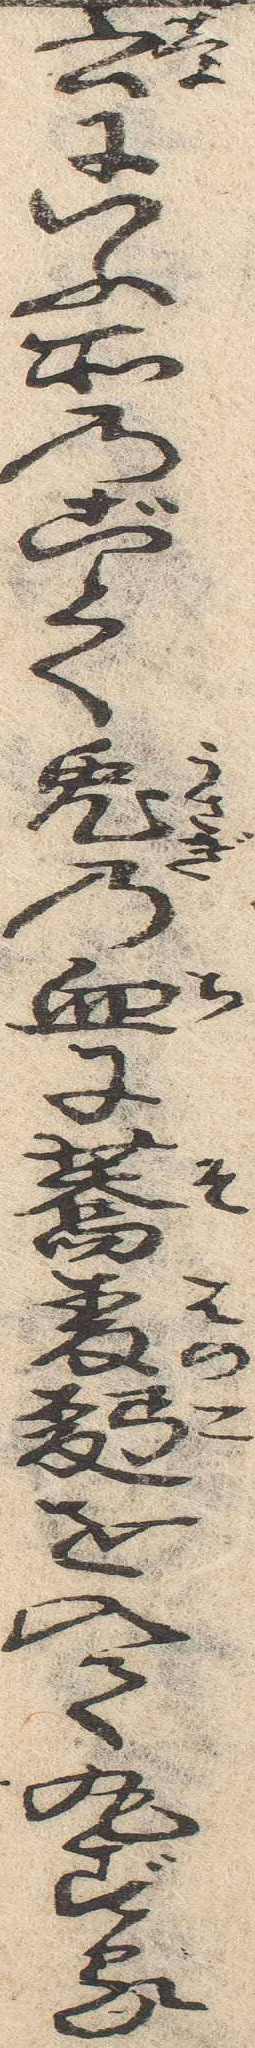書にいふ所のごとく兔の血に蕎麦麪を入て丸ずる
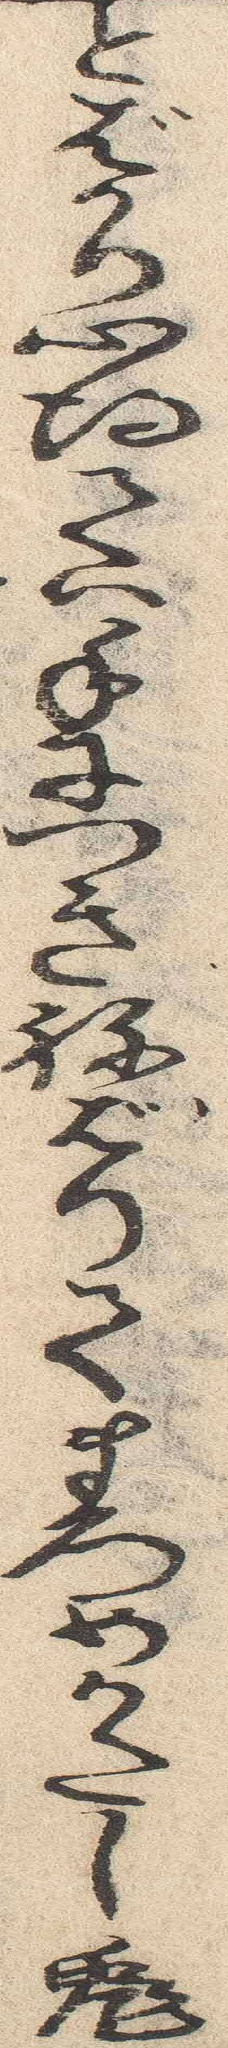とばかり心得ては手につきねばりてまろめかたし兔
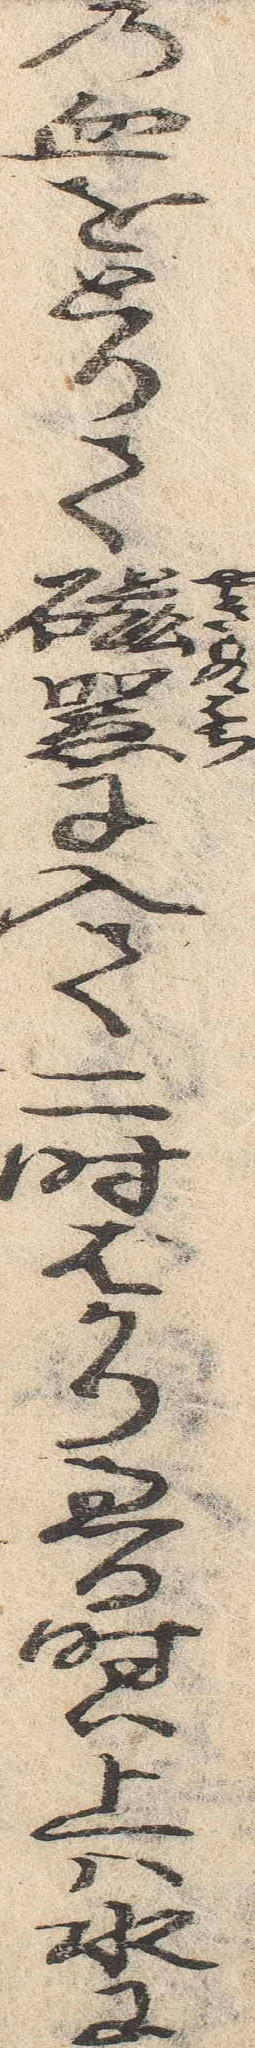の血をとりて磁器に入て二時ばかり過る時は上は水に
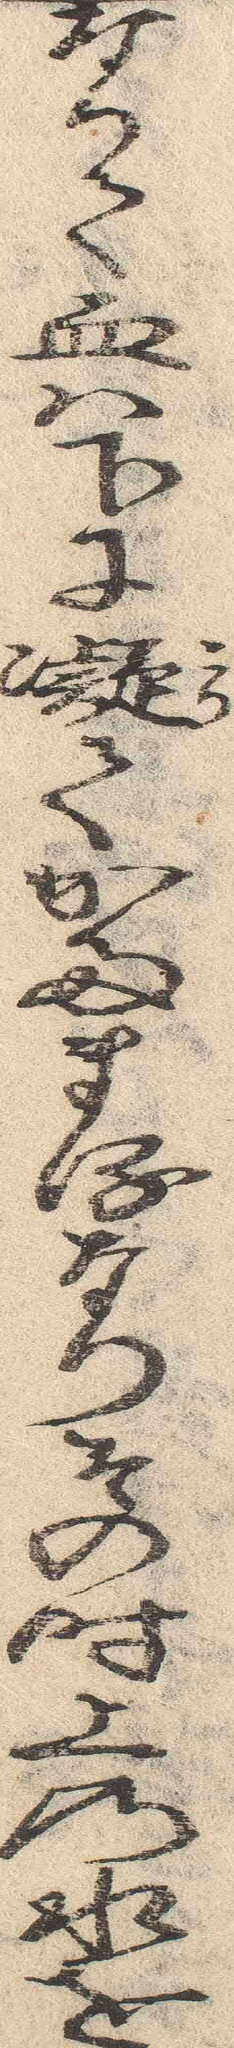なりて血は下に凝てかたまるなりその時上の水を
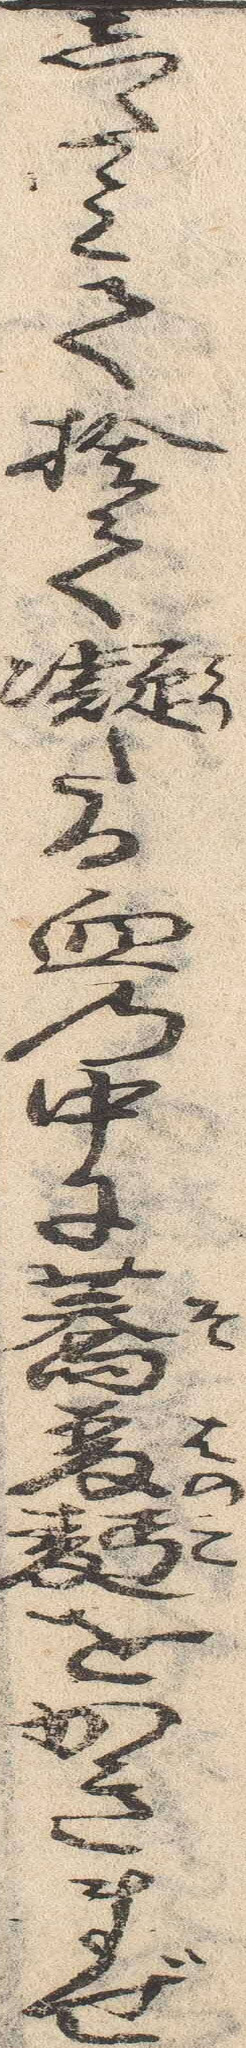したみて捨て凝たる血の中に蕎麦麪をかきまぜ
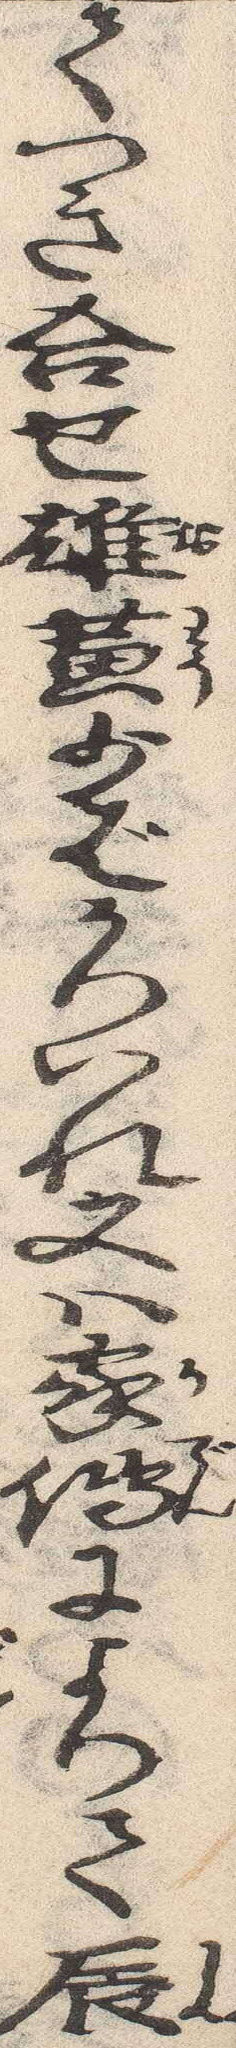てつき合せ雄黄少ばかりいれ又は家伝によりて辰
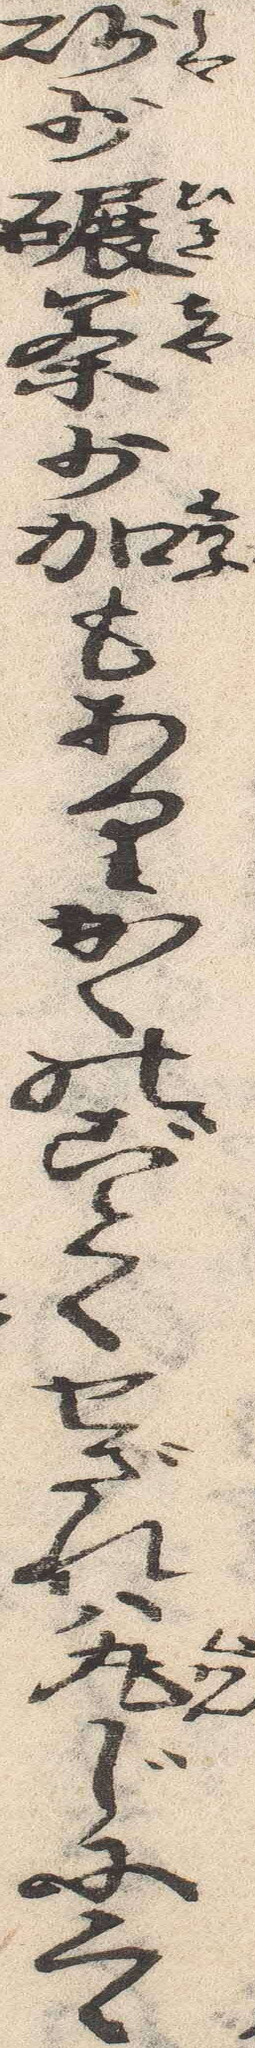砂少碾茶少加もありかくのごとくせざれは丸じにくゝ
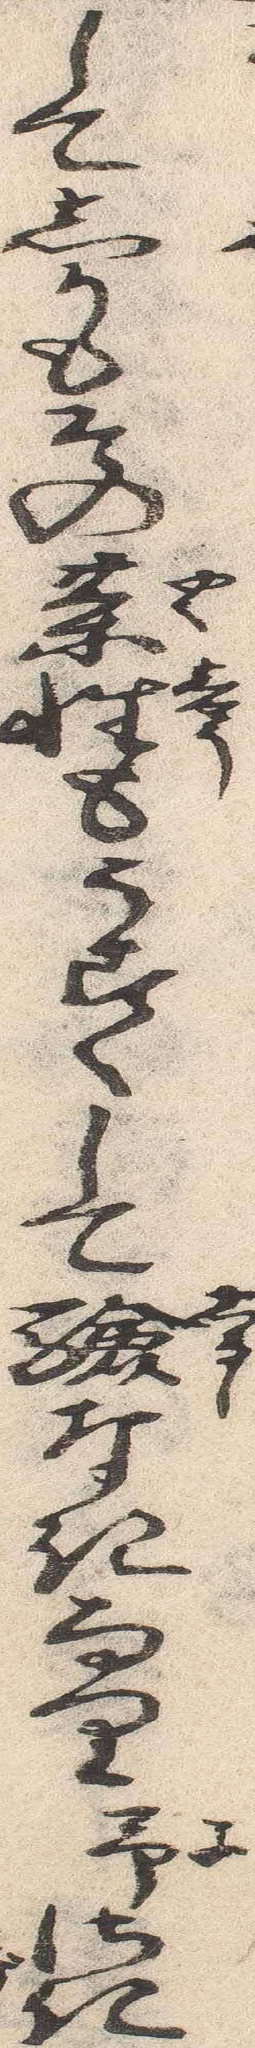してしかもその薬性もうすくして験なきなり予さき
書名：小児必用養育草
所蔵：東京学芸大学附属図書館 国文学研究資料館
